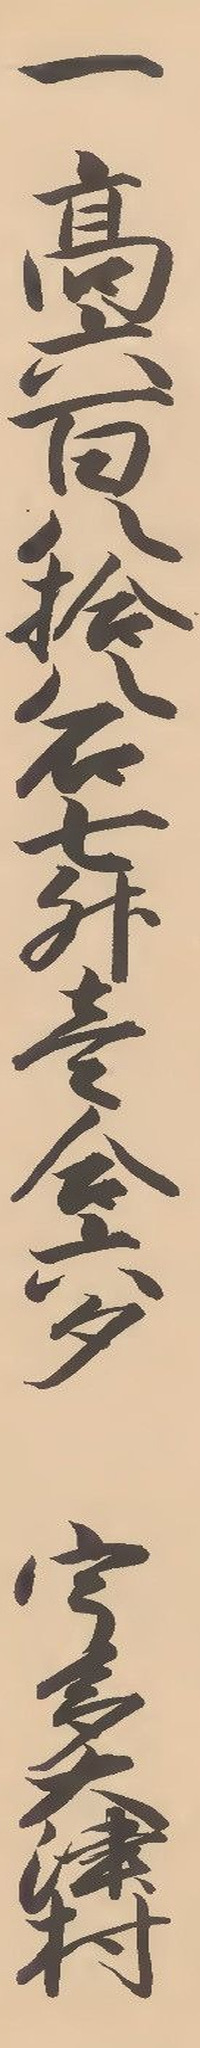一高六百八拾八石七升壱合六勺宇多大津村
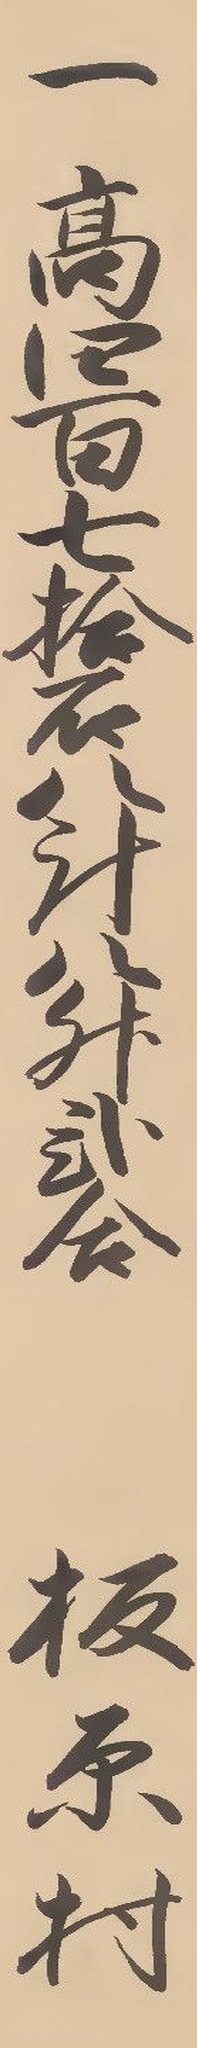一高四百七拾石八斗八升弐合板原村
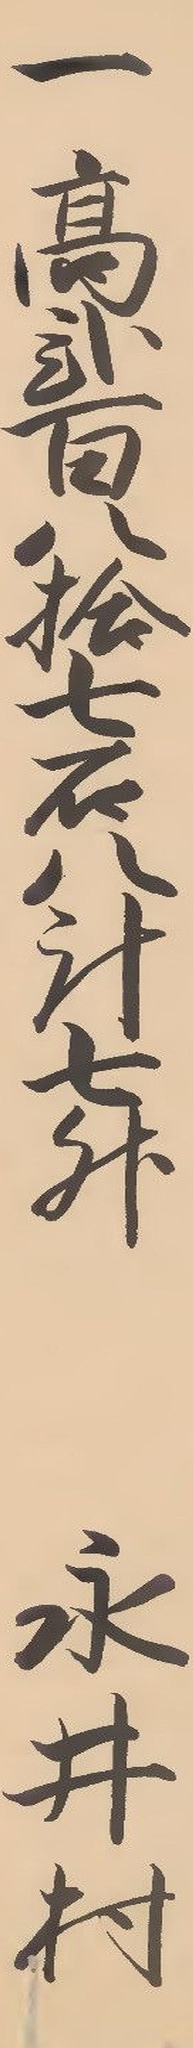一高弐百八拾七石八斗七升永井村
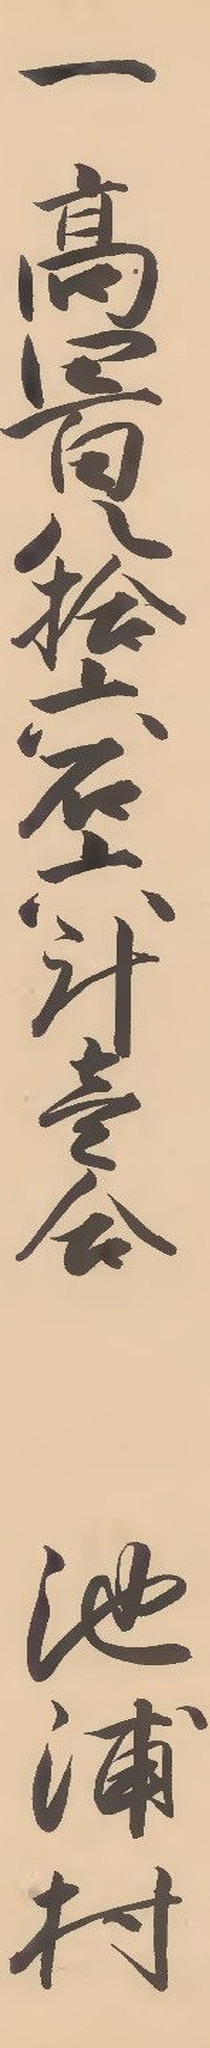一高四百八拾六石六斗壱合池浦村
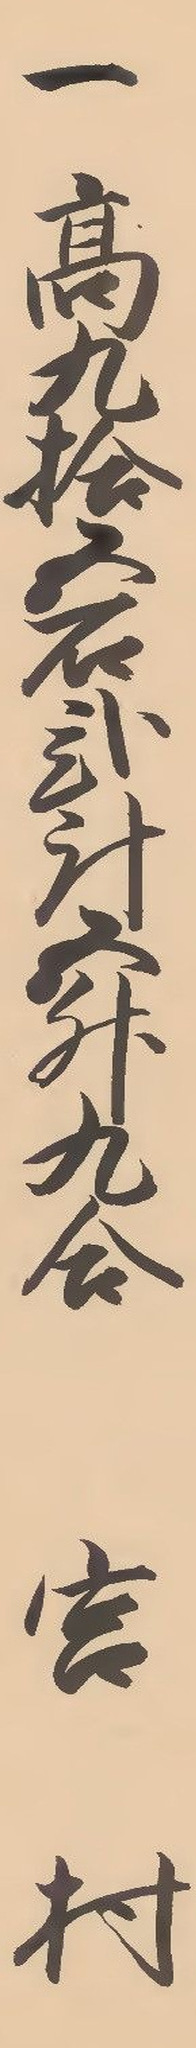一高九拾五石弐斗五升九合宮村

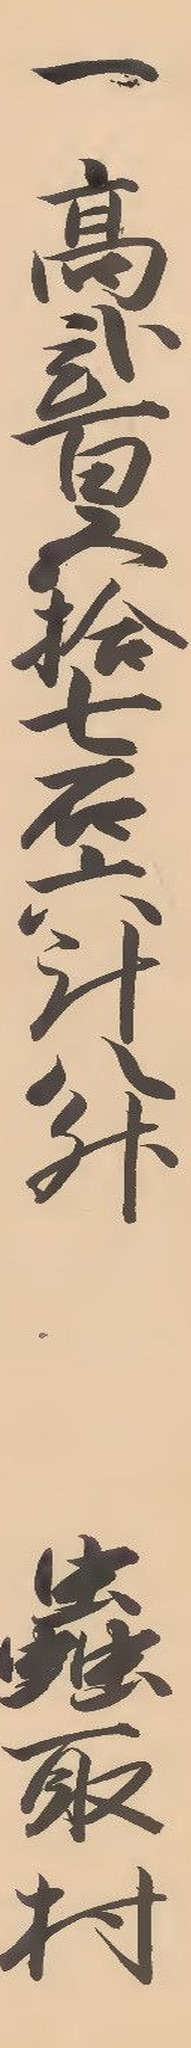一高弐百五拾七石六斗八升虫取村
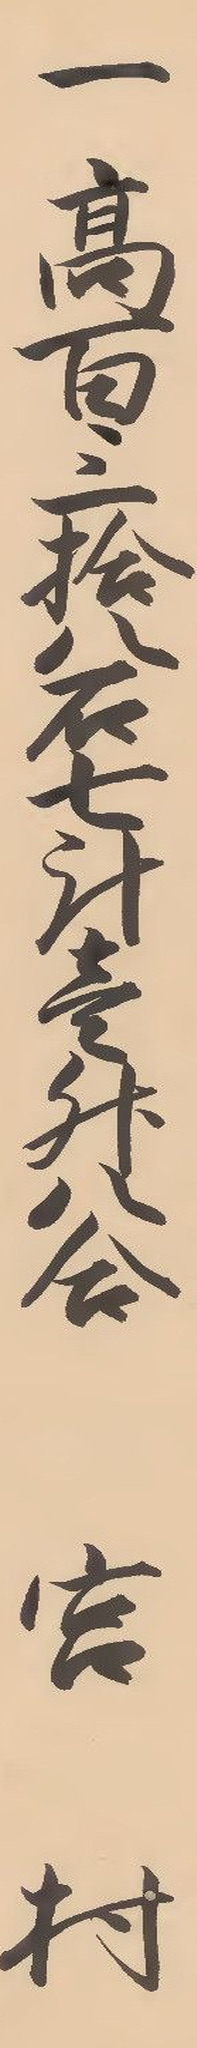一高百三拾八石七斗壱升八合宮村
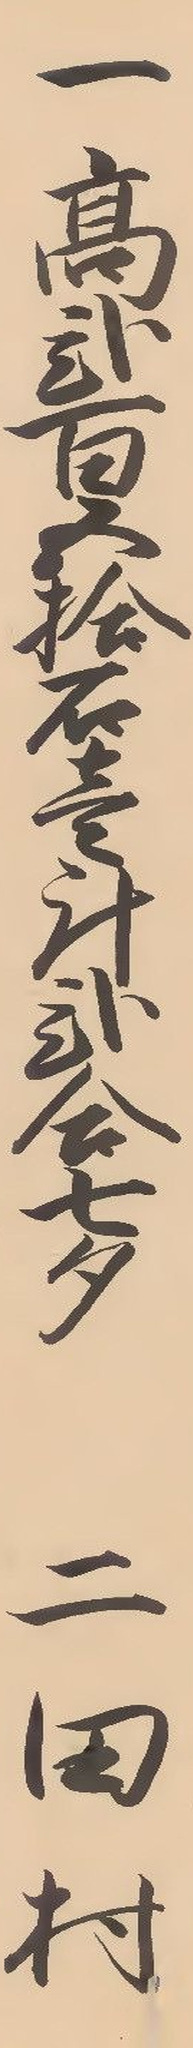一高弐百五拾石壱斗弐合七勺二田村
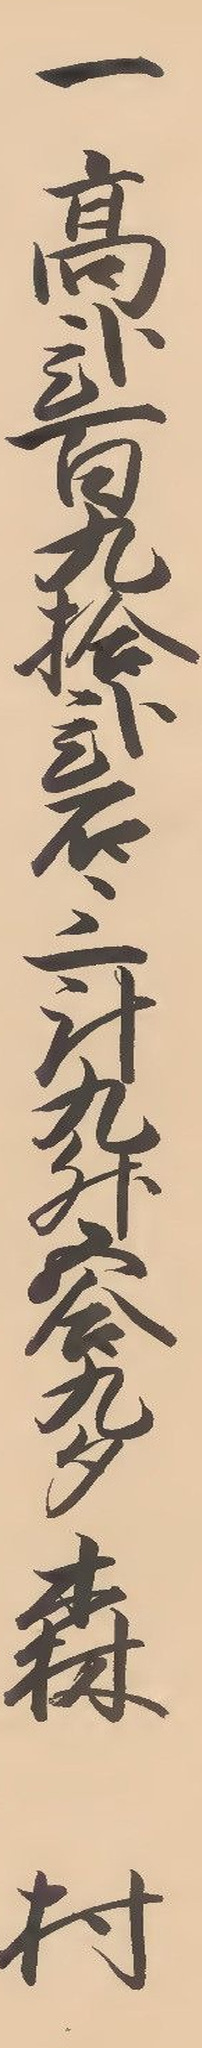一高弐百九拾弐石三斗九升五合九勺森村
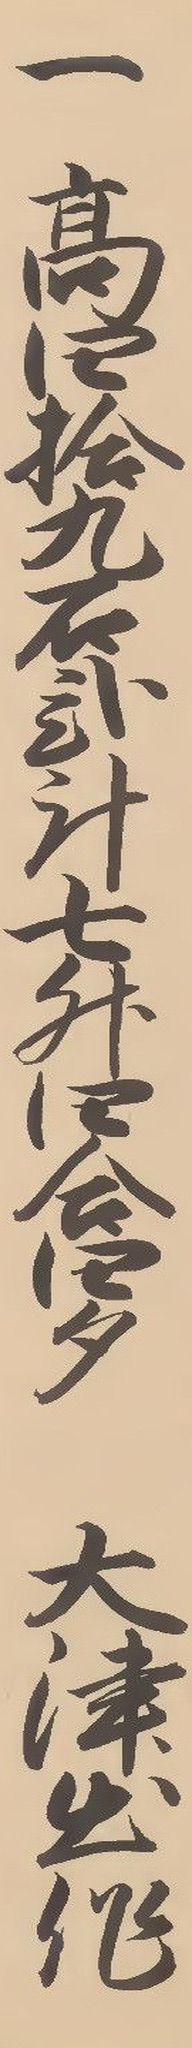一高四拾九石弐斗七升四合四勺大津出作
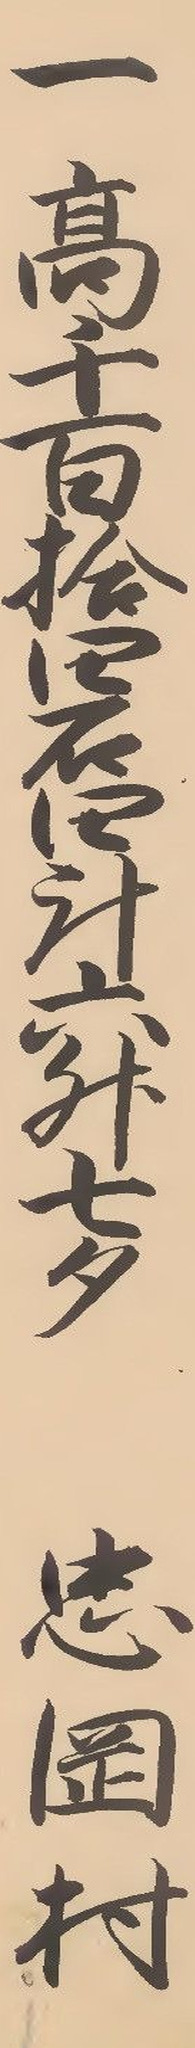一高千百拾四石四斗六升七勺忠岡村
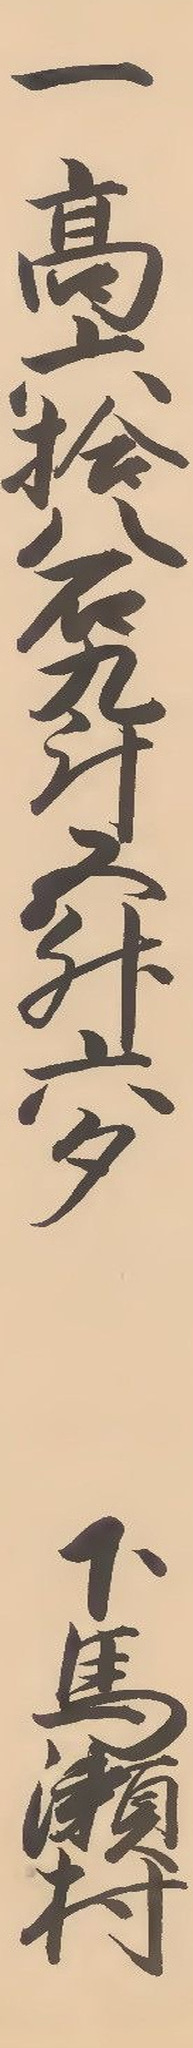一高六拾八石九斗五升六勺下馬瀬村
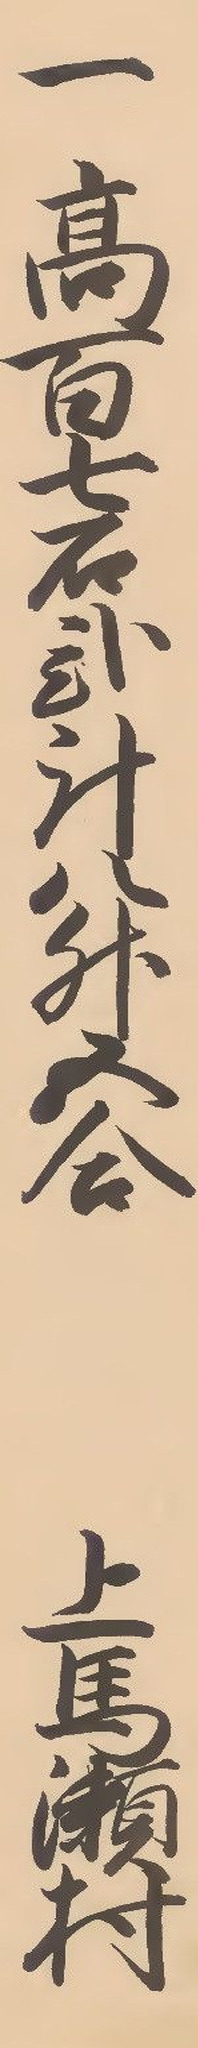一高百七石弐斗八升五合上馬瀬村

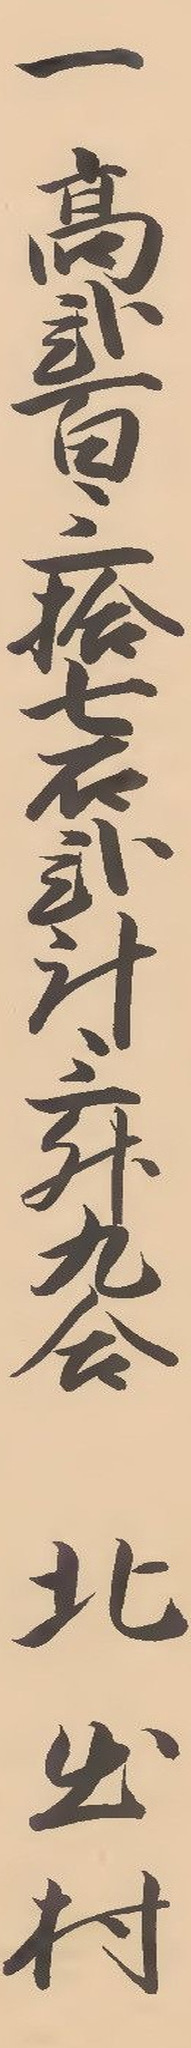一高弐百三拾七石弐斗三升九合北出村
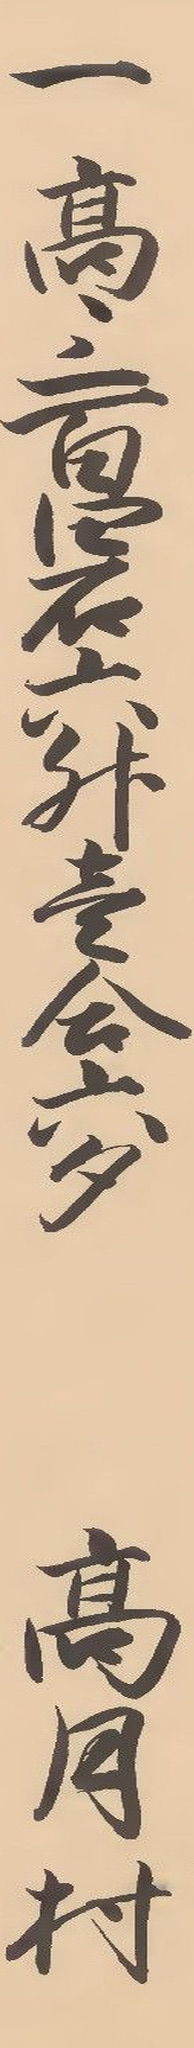一高三百四石六升壱合六勺高月村
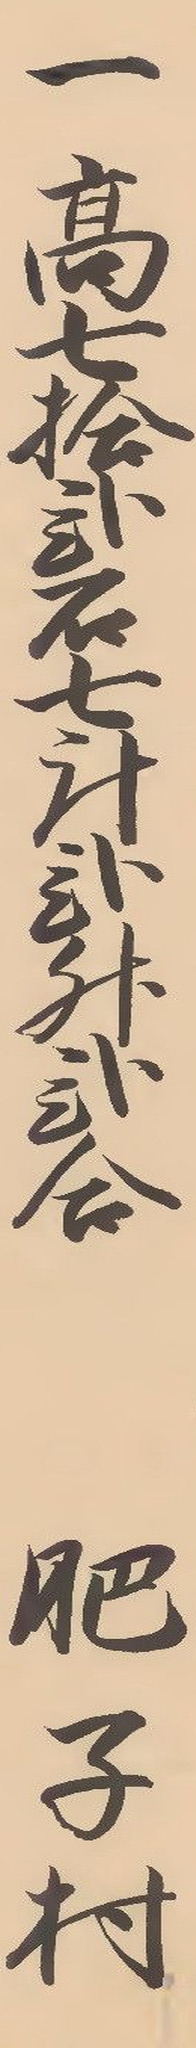一高七拾弐石七斗弐升弐合肥子村
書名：和泉国郷帳
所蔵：国立公文書館 National Archives of Japan
